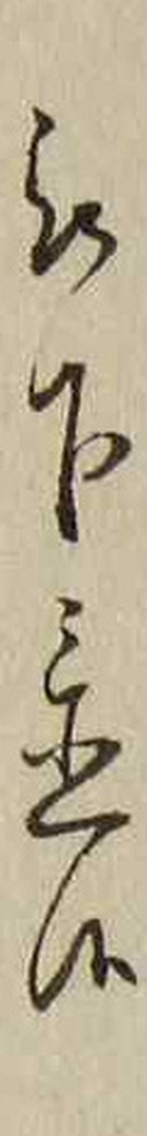被下置候

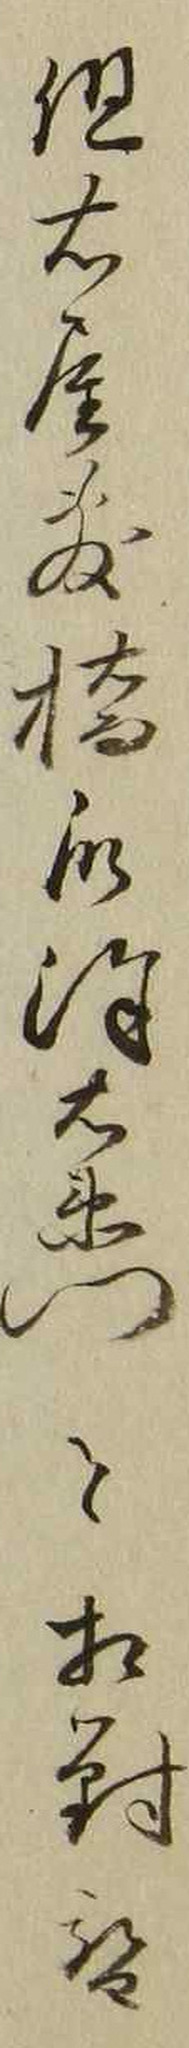但右屋敷橋爪沢右衛門と相対替
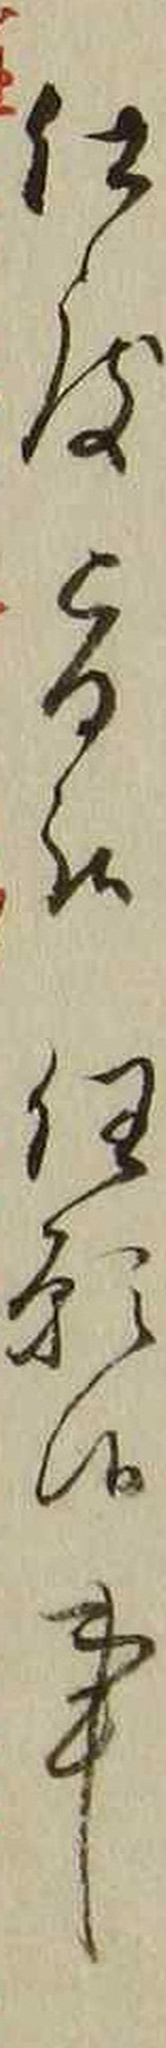仕度旨被任願候事
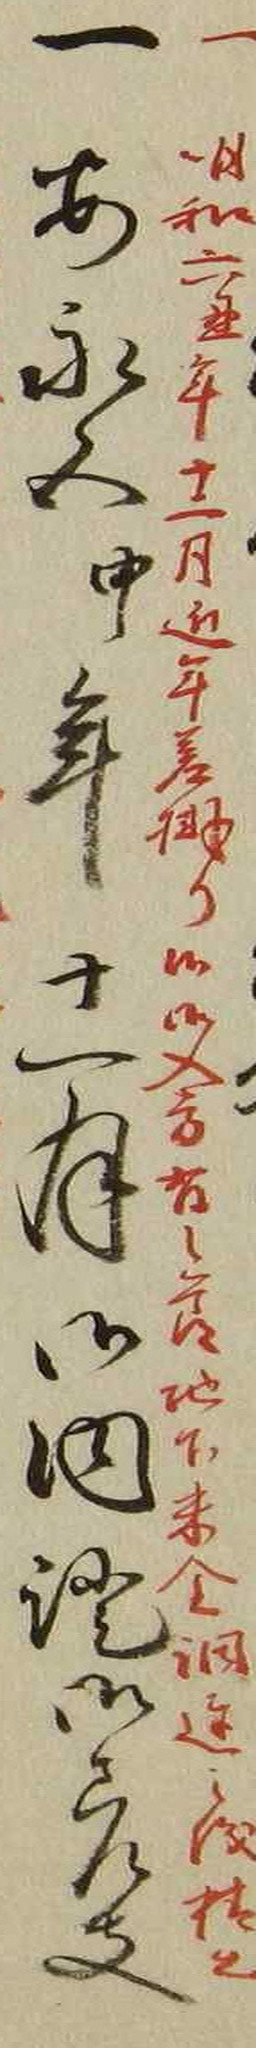一安永五申年十一月御内証御差支
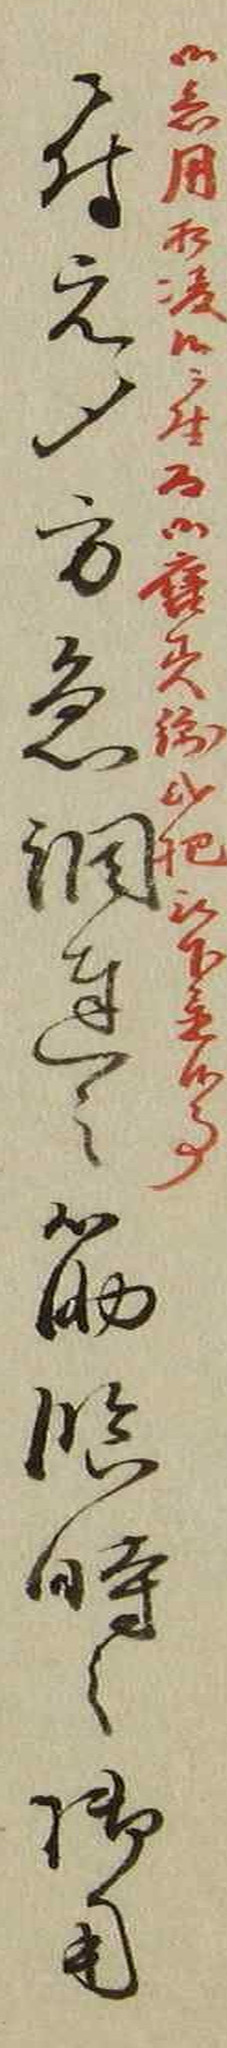ニ付元〆方急調達之筋臨時之御用
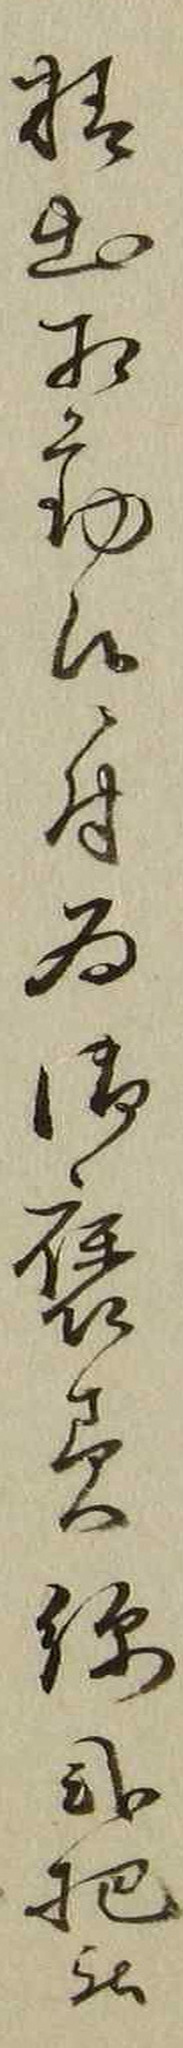精出相勤候ニ付為御褒美綿弐把被
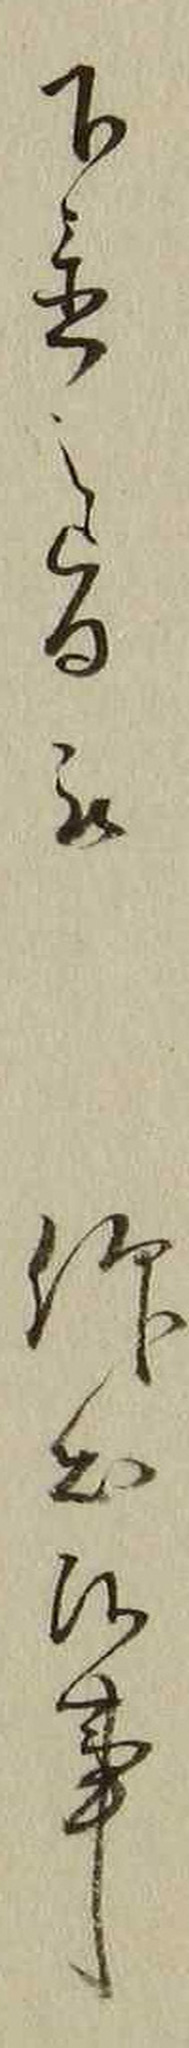下置候旨被仰出候事
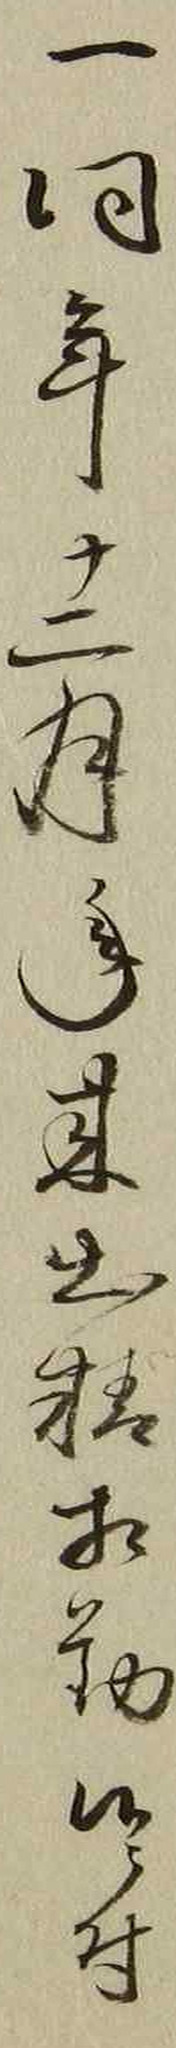一同年十二月年来出精相勤候ニ付
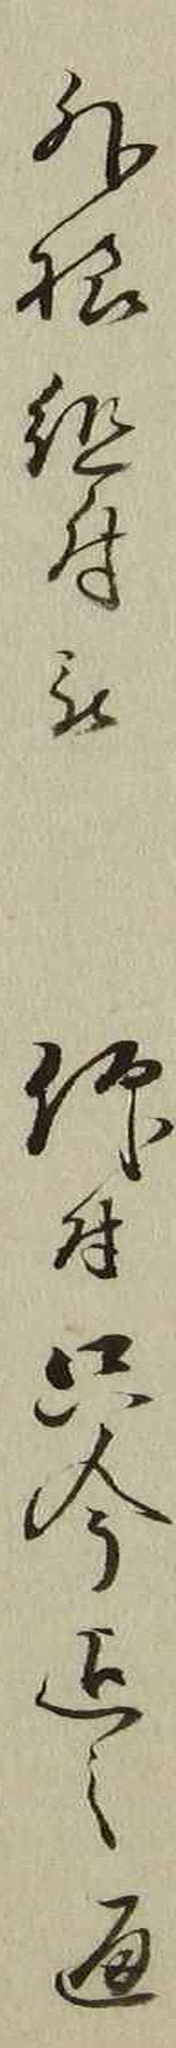外様組付被仰付只今迄之通
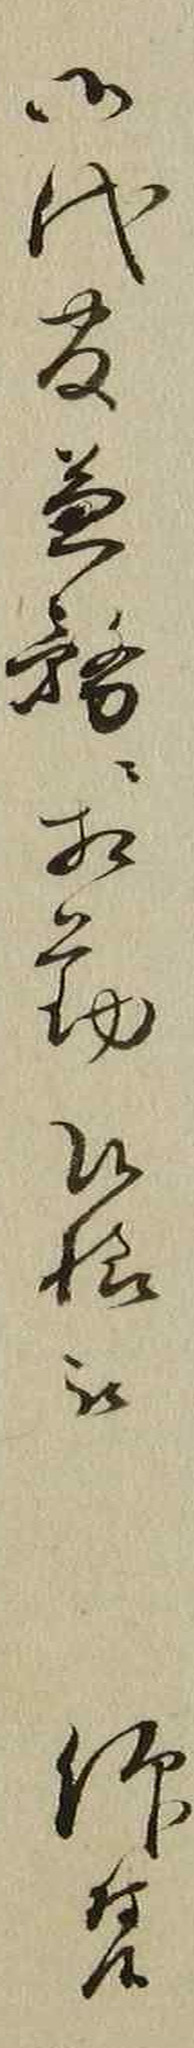御代官兼務ニ相勤候様被仰付候
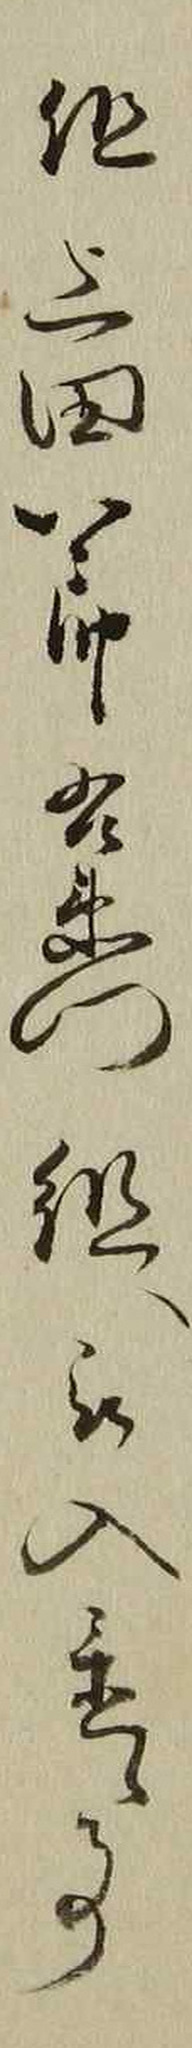但上田八郎右衛門組へ被入置候事
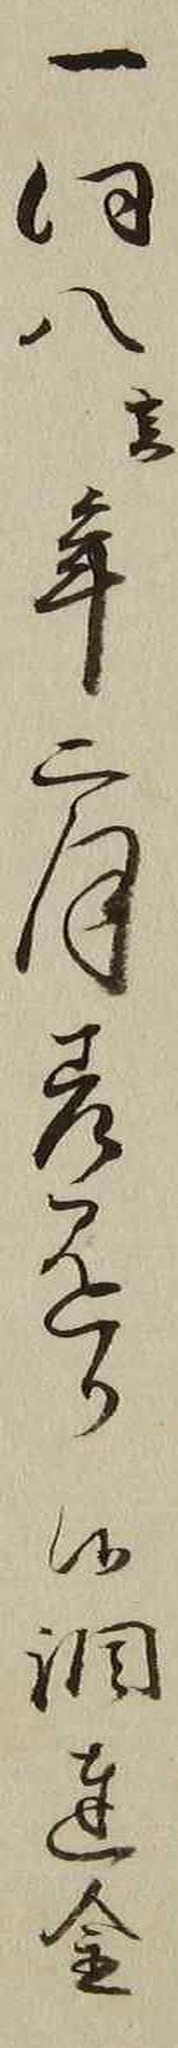一同八亥年二月差懸り候調達金
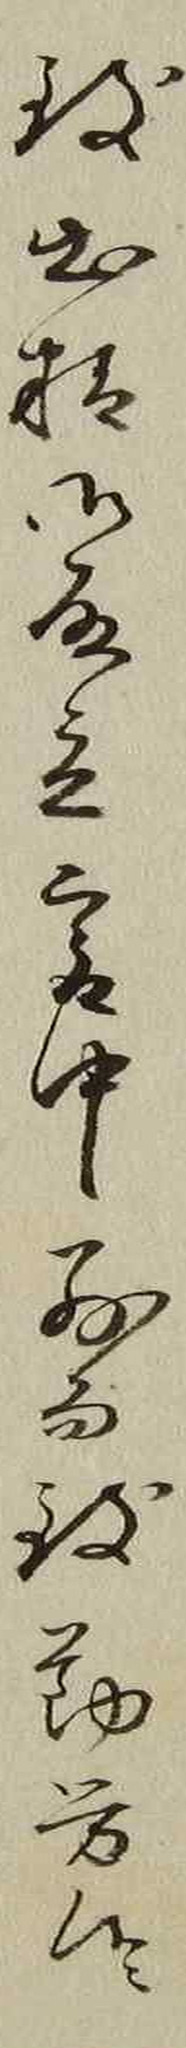致出精御取立最中別而致勤労候ニ
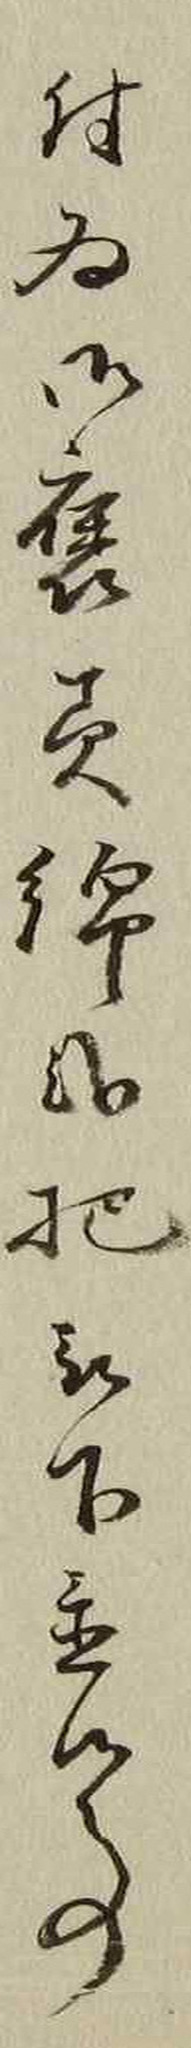付為御褒美綿弐把被下置候事
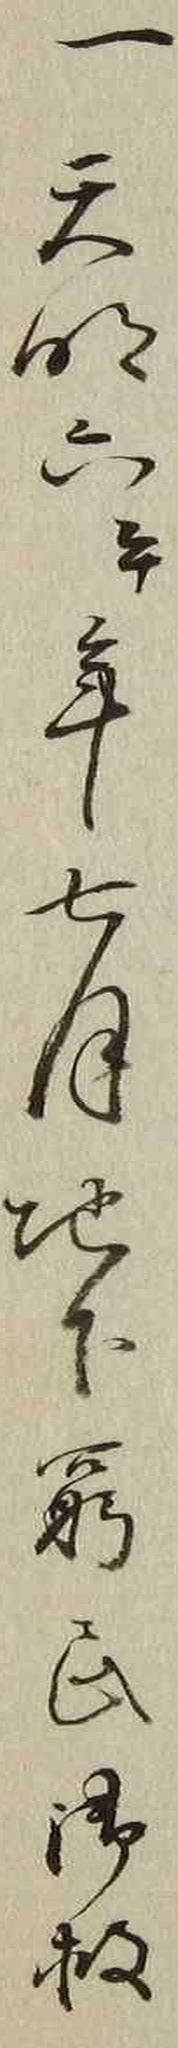一天明六午年七月地下窮民御救
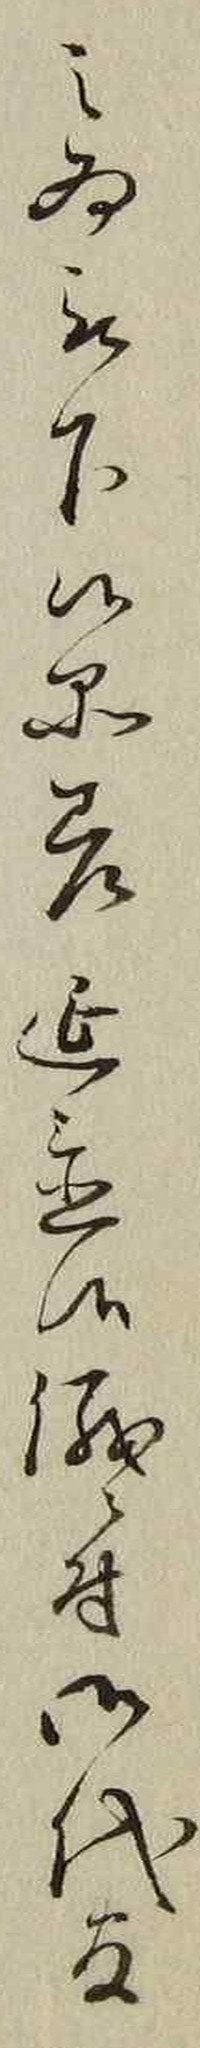之為被下候品差延置候儀ニ付御代官
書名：諸士系譜　巻之4　い之部4
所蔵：会津若松市立会津図書館
